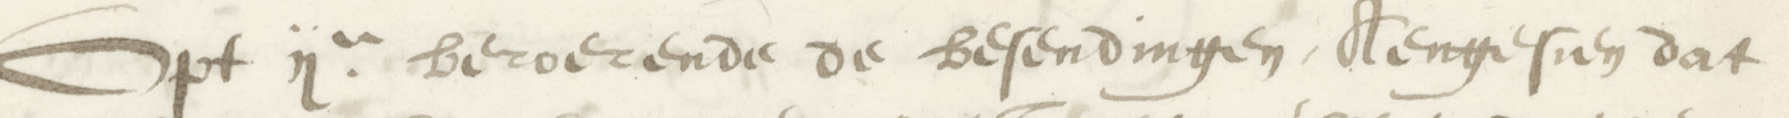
Opt ije beroerende de besendingen, Aengesien dat
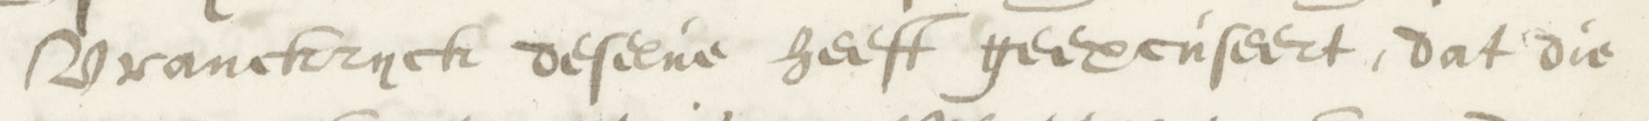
Vranckryck deselue heeft geexcuseert, dat die
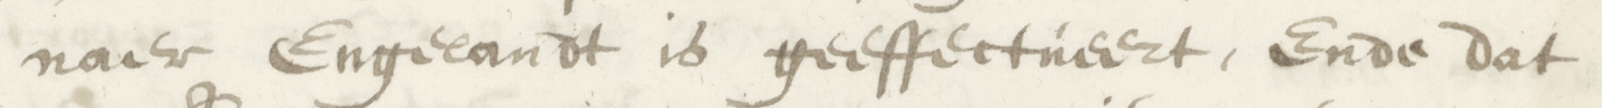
naer Engelandt is geeffectueert, Ende dat
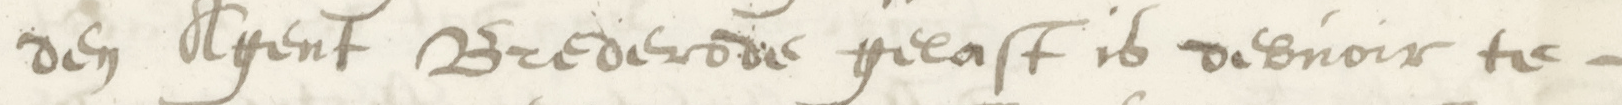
den Agent Brederode gelast is debuoir te
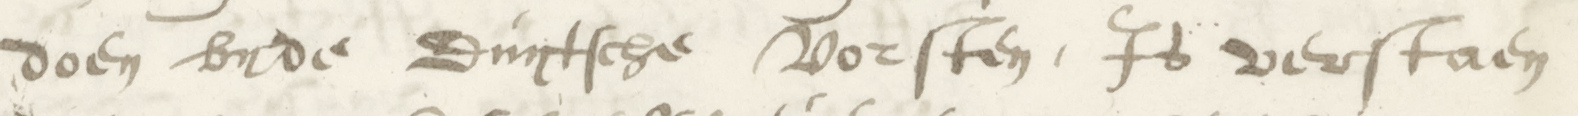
doen by de Duytsche Vorsten. Is verstaen
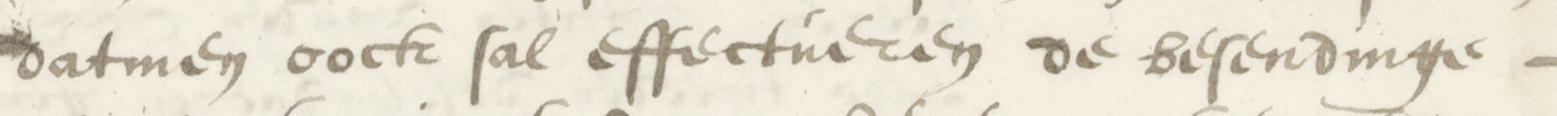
datmen oock sal effectueren de besendinge
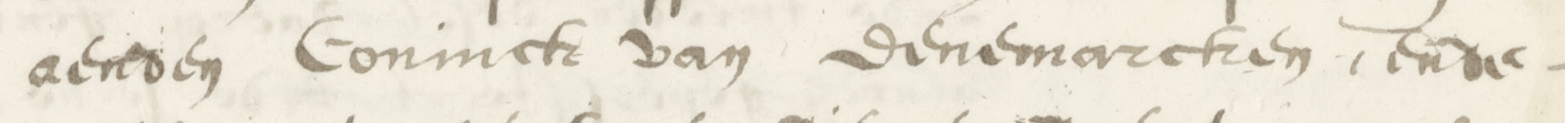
aenden Coninck van Denemarcken, ende
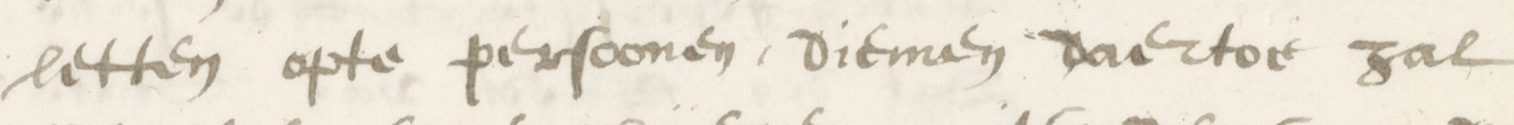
letten opte persoonen, diemen daertoe zal
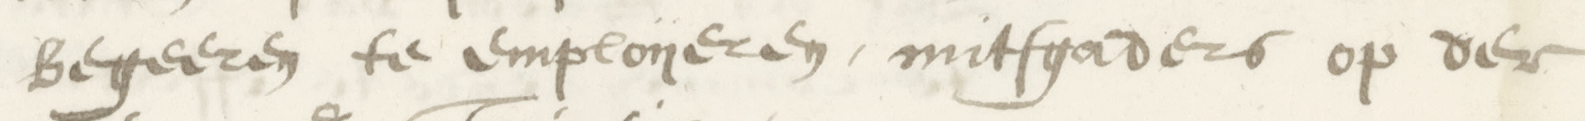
begeeren te emploijeren, mitsgaders op der
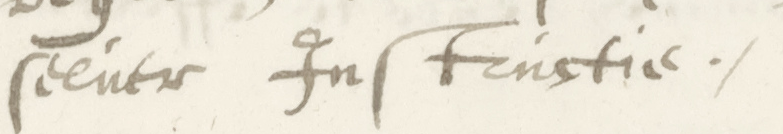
seluer instructie.
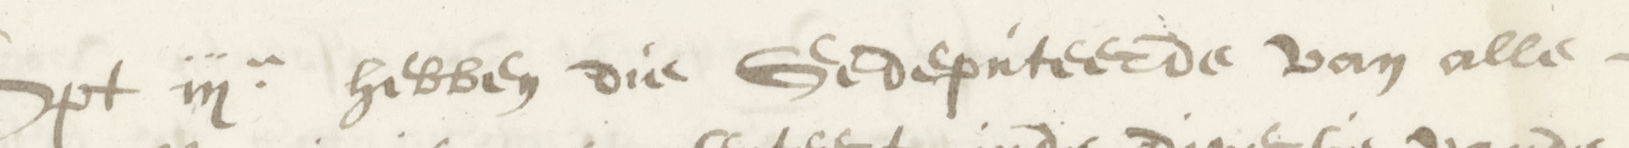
Opt iije hebben die Gedeputeerde van alle
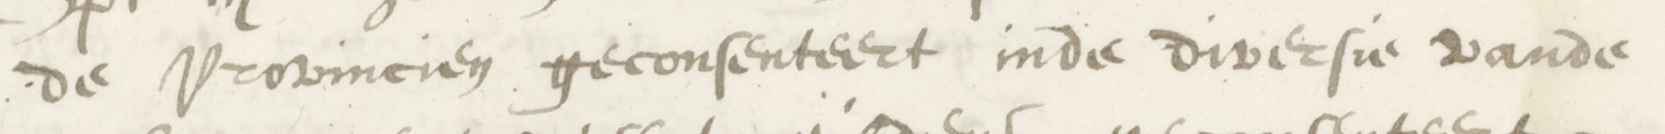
de Provincien geconsenteert inde diversie vande
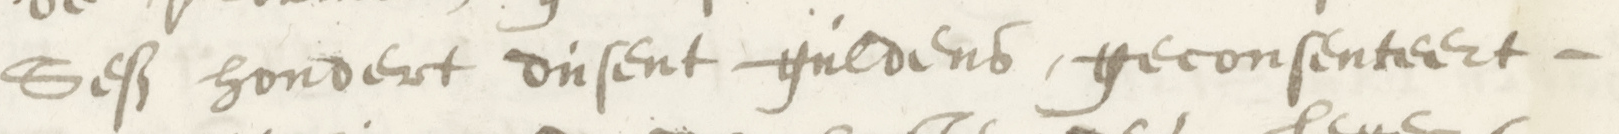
Sess hondert dusent guldens, geconsenteert
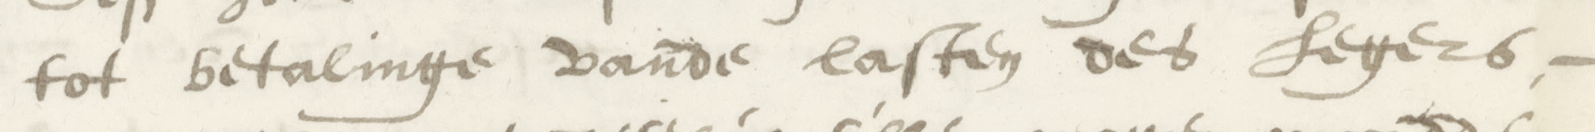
tot betalinge vande lasten des Legers
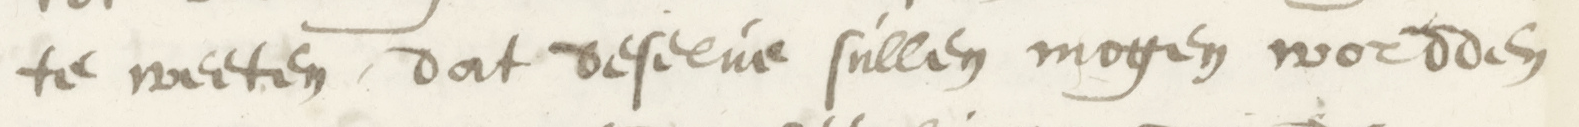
te weeten, dat deselue sullen mogen wordden
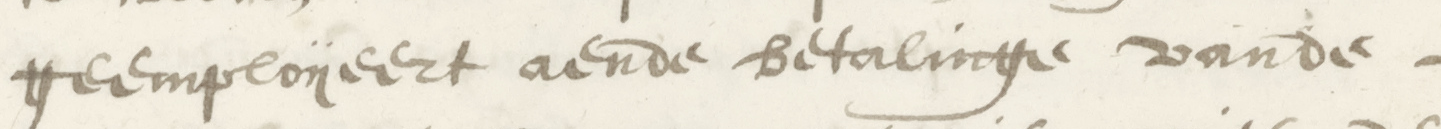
geemploijeert aende betalinge vande
